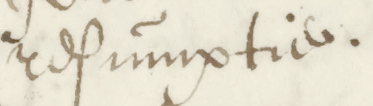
resumptie.
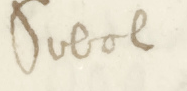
Swol
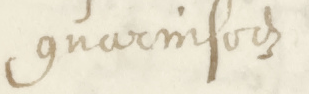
guarnisoen
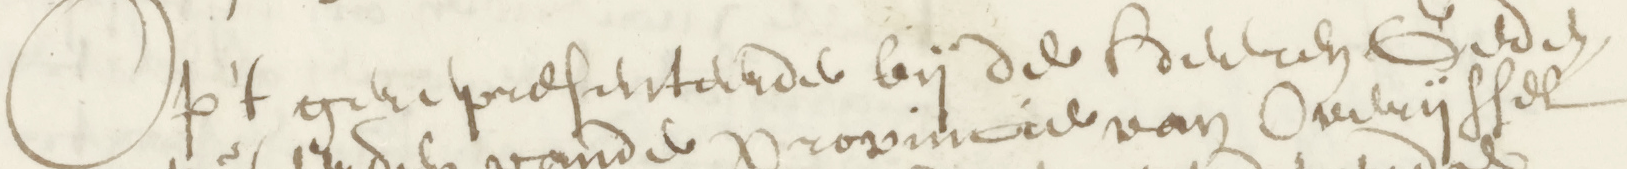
Op't gerepresenteerde bij de Heeren Gede,
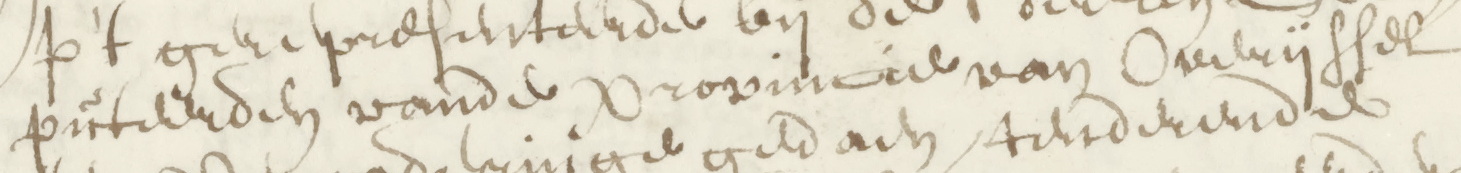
puteerden vande Provincie van Overijssel
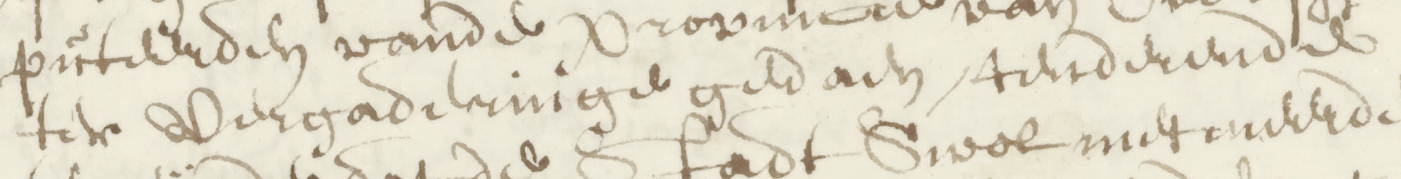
ter Vergaderinge gedaen, tenderende
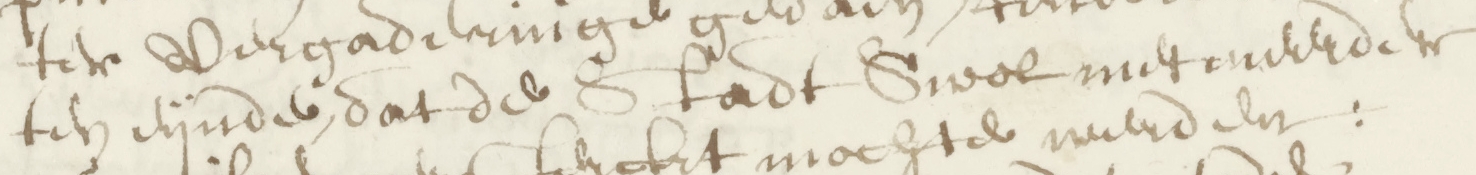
ten eijnde, dat de Stadt Swol met meerder
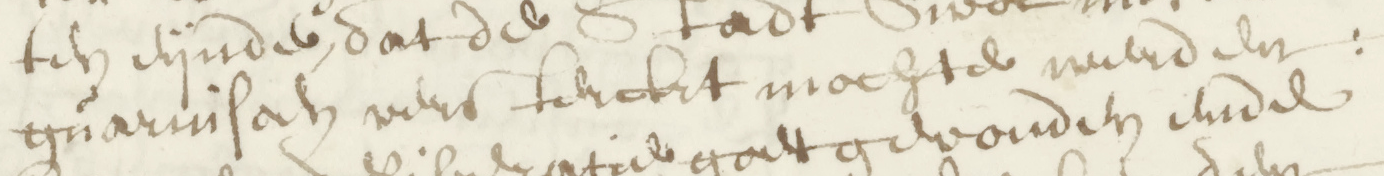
guarnisoen versterckt mochte werden:
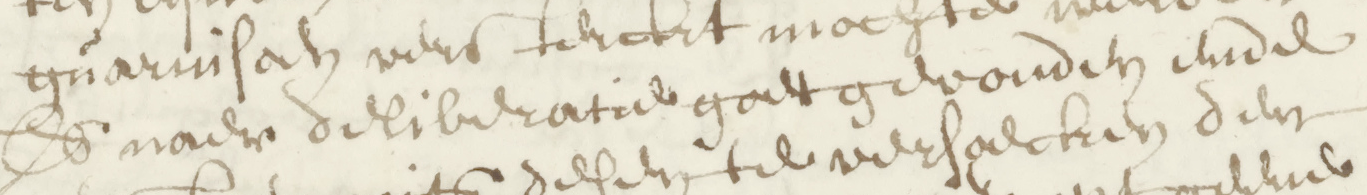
Is naer deliberatie goetgevonden ende
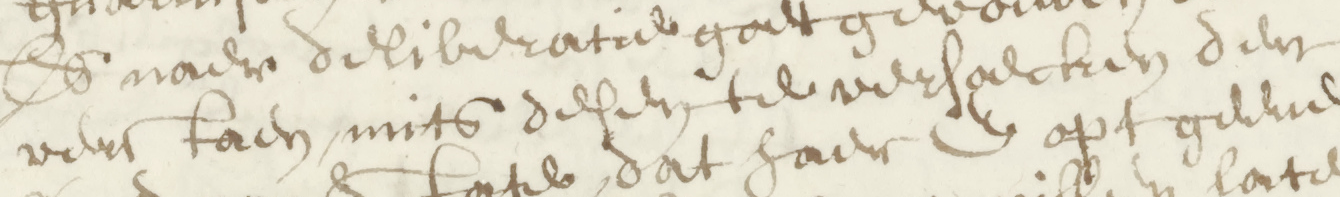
verstaen, mits desen te versoecken den
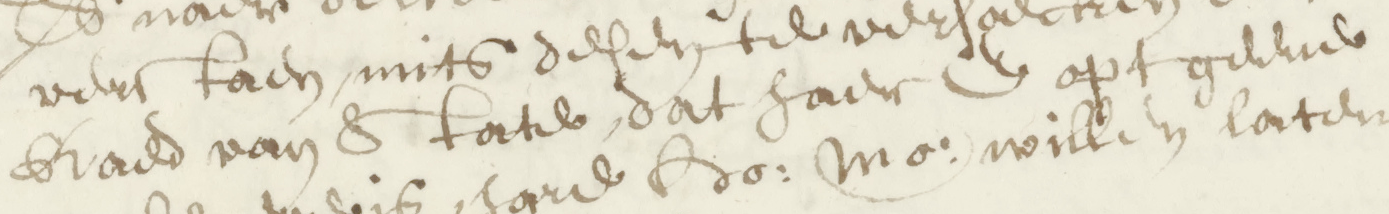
Raed van State, dat haer E. opt geene
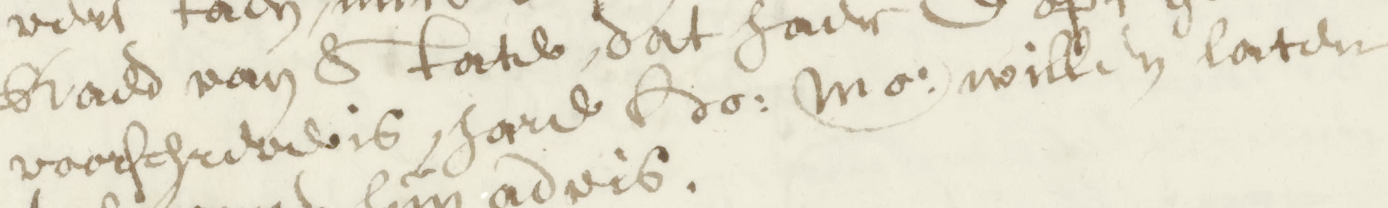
voorschreve is, hare Ho:Mo: willen laten
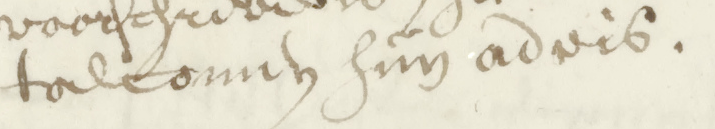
toe comen hun advis.
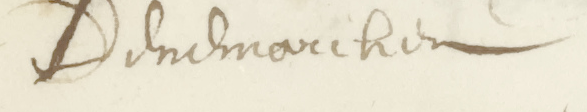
Denemarcken
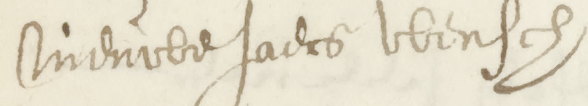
nieuwe Jaers wensch,
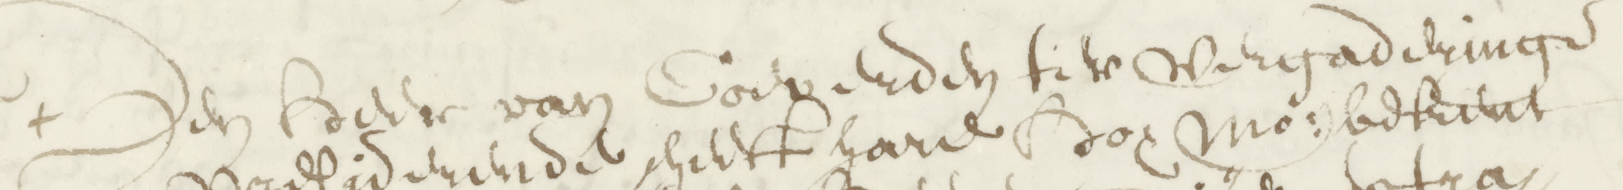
Den Heer van Coeverden ter Vergaderinge
